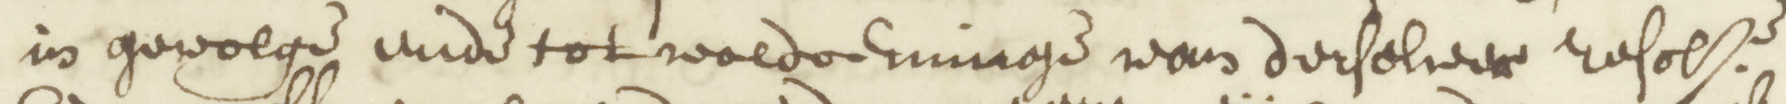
in gevolge ende tot voldoeninge van derselver resole. —
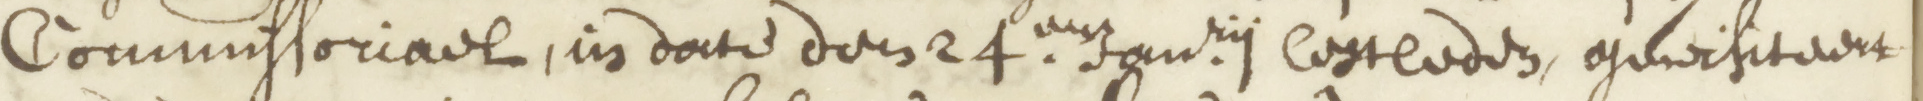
Commissoriael, in date den 24en. Janrij. lestleden, gevisiteert
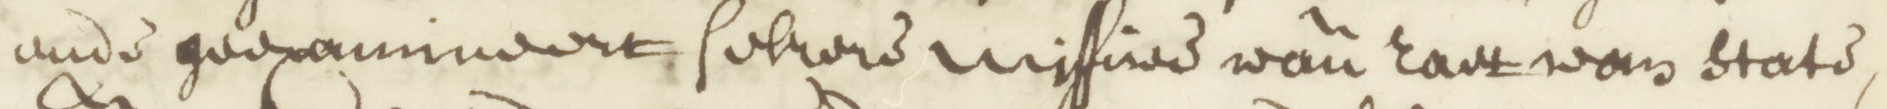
ende geexamineert sekere missive van Raet van State,
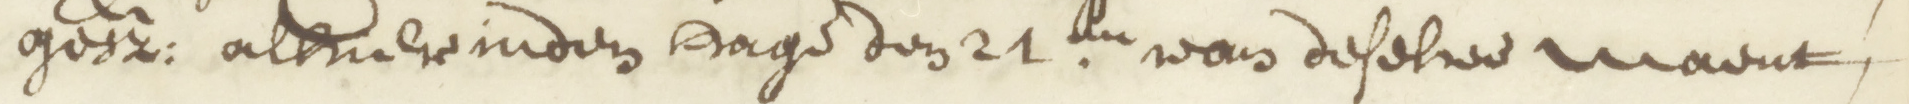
gesr. alhier inden Hage den 21en. van deselve maent,
